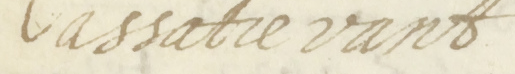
Cassatie vant
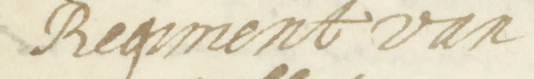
Regiment van
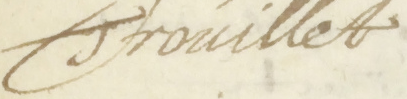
Trouillet
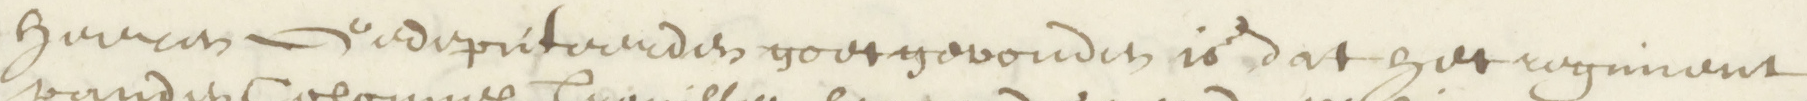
heeren Gedeputeerden goetgevonden is dat het regiment
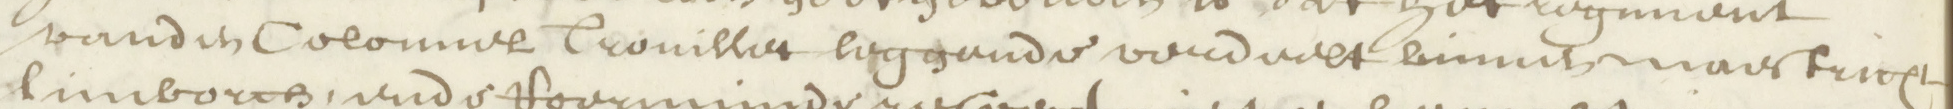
vanden Colonnel Trouillet leggende verdeelt binnen Maestricht
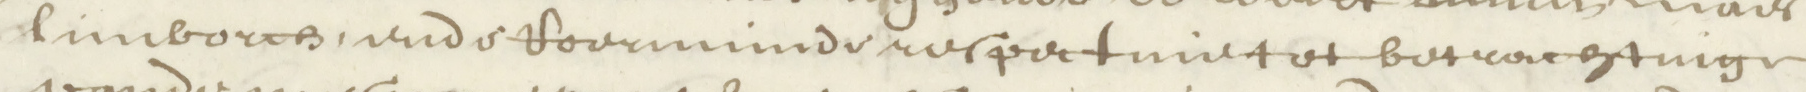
Limborch, ende Roermunde respectiue tot betrachtinge
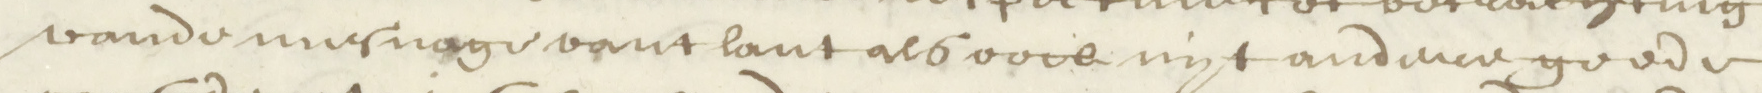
vande mesnage vant lant als oock uyt andere goede
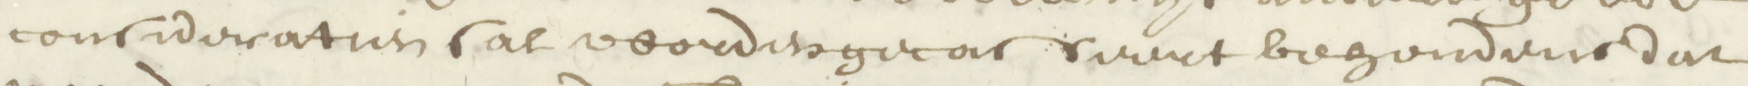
consideratien sal worden gecasseert behoudens dat
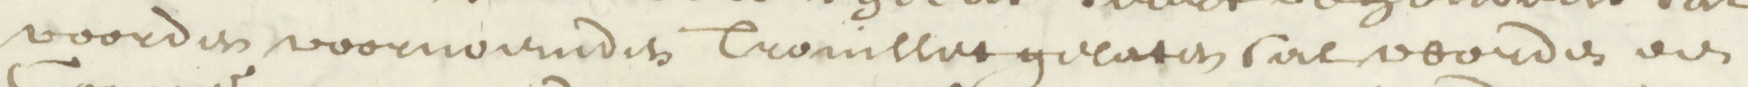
voorden voornoemden Trouillet gelaten sal worden een
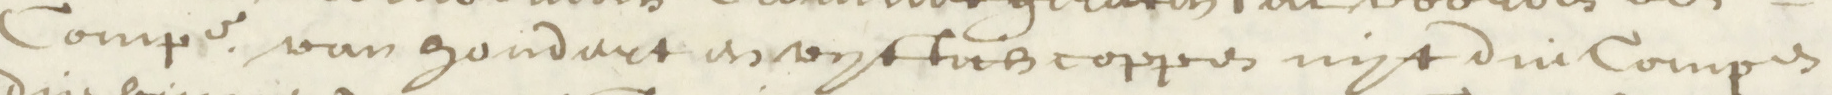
Compe. van hondert en vyftich coppen uyt die Compen
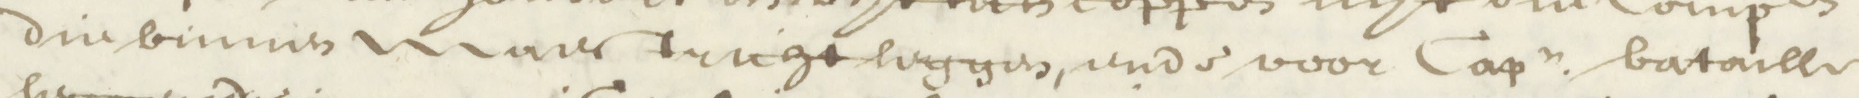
die binnen Maestricht leggen, ende voor Capn. bataille
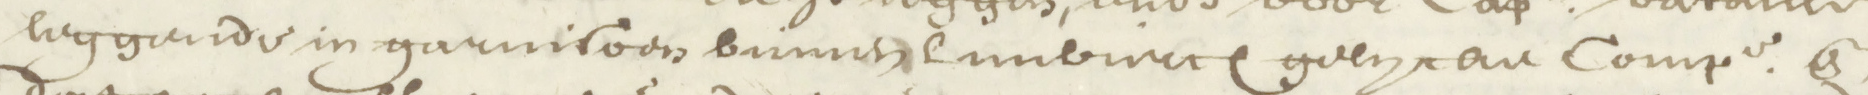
leggende in garnisoen binnen limburch gelycke Compe. &
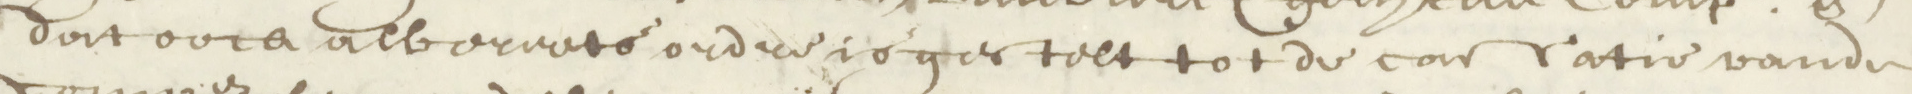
dat oock albereets ordre is gestelt tot de cassatie vande
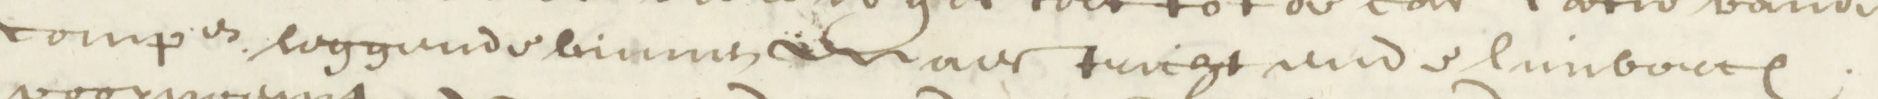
compen. leggende binnen Maestricht ende limborch
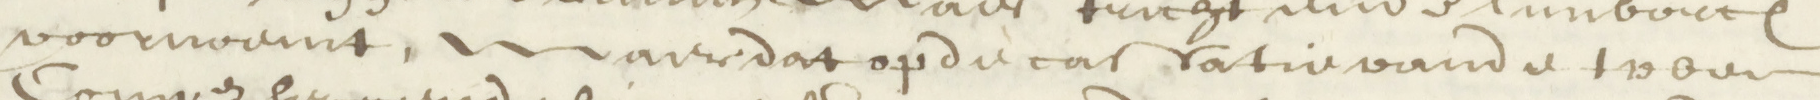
voornoemt, Maer dat op de cassatie vande twee
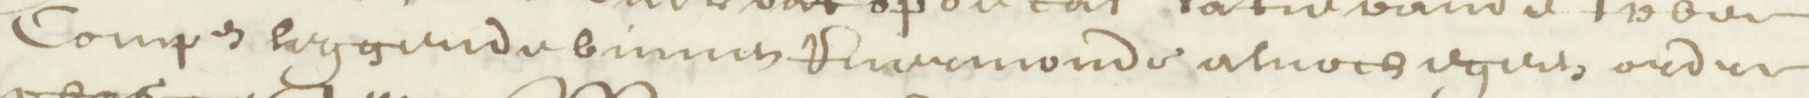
Compen leggende binnen Ruermonde alnoch egeen ordre
